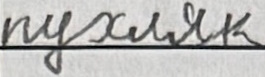пухляк
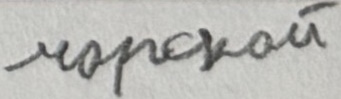морской
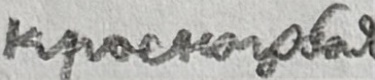краснозобая
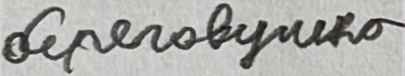береговушка
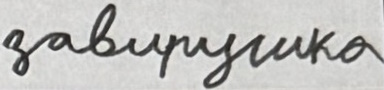завирушка
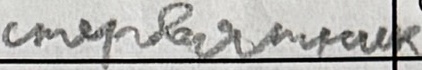стервятник
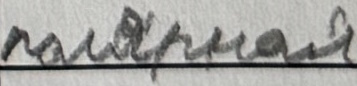полярная
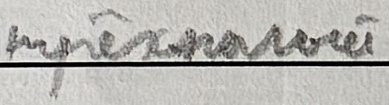трёхпалый
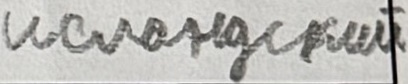исландский
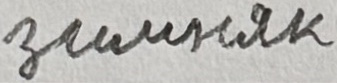зимняк
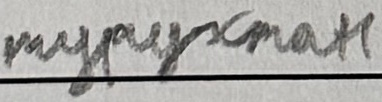турухтан
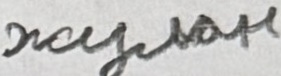жулан
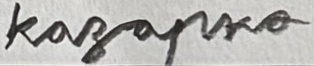казарка
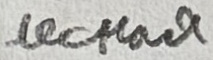лесная
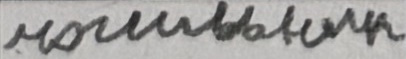могильник
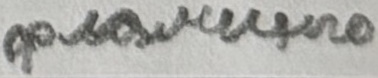фламинго
